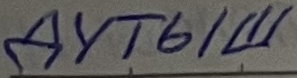дутыш
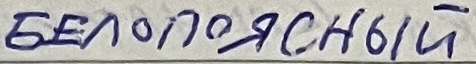белопоясный
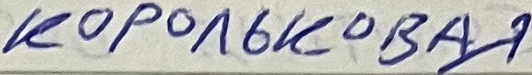корольковая
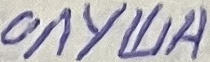олуша
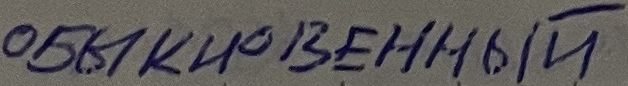обыкновенный
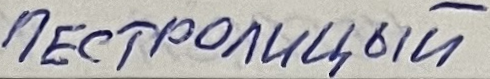пестролицый
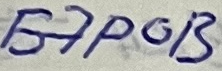бэров
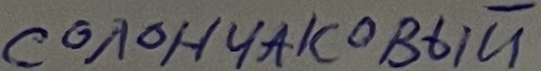солончаковый
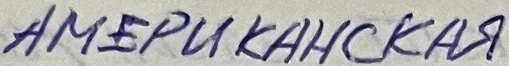американская
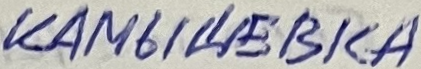камышевка
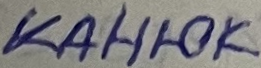канюк
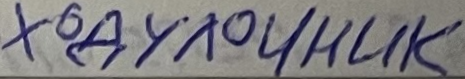ходулочник
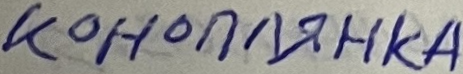коноплянка
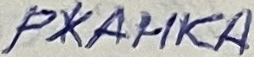ржанка
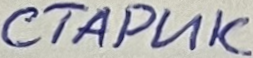старик
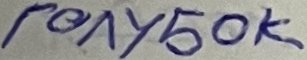голубок
